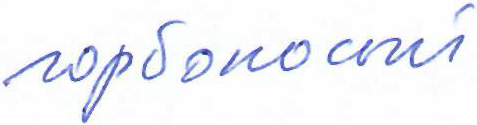горбоносый
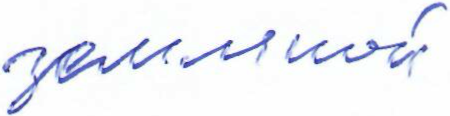земляной
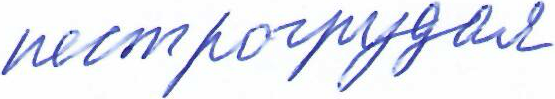пестрогрудая
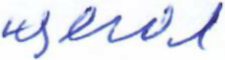щегол
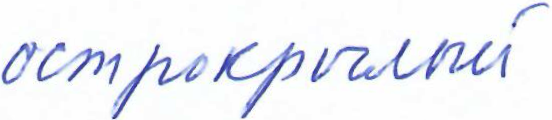острокрылый
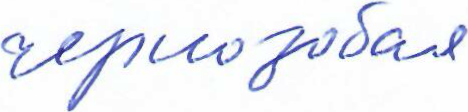чернозобая
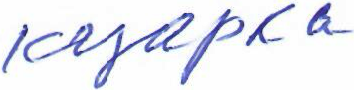казарка
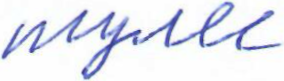тулес
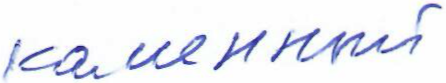каменный
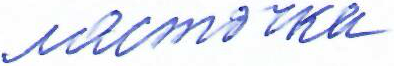ласточка
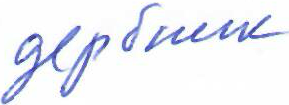дербник
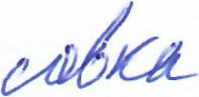савка
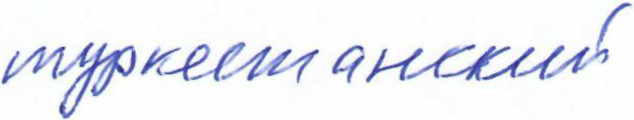туркестанский
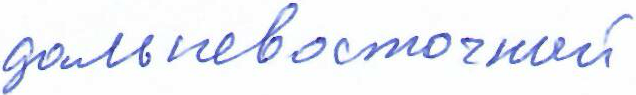дальневосточный
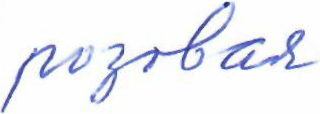розовая
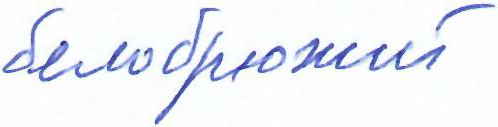белобрюхий
